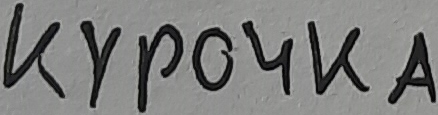курочка
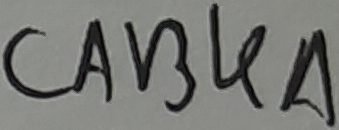савка
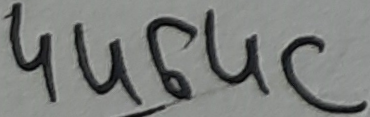чибис
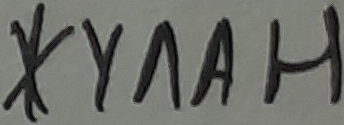жулан
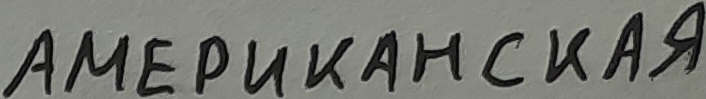американская
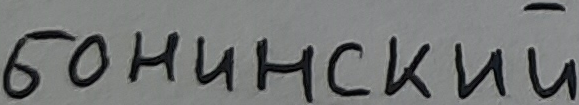бонинский
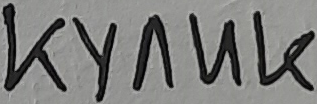кулик
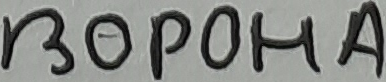ворона
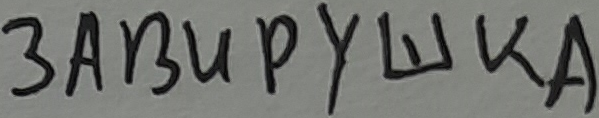завирушка
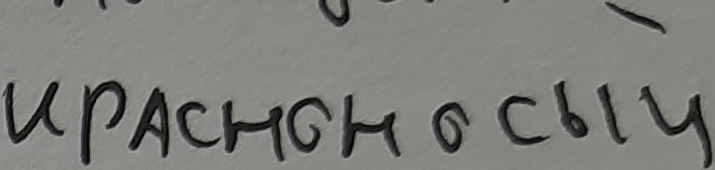красноносый
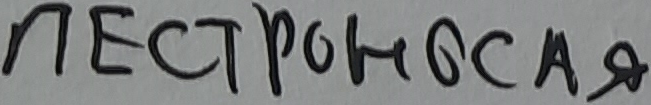пестроносая
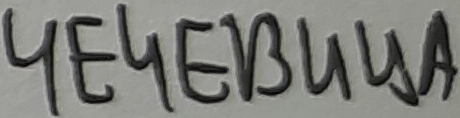чечевица
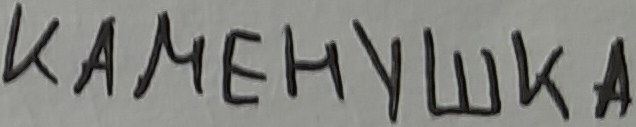каменушка
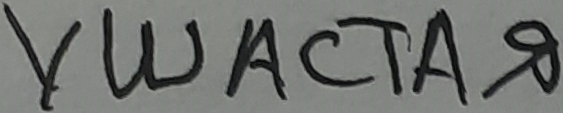ушастая
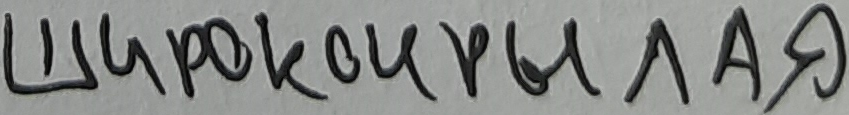ширококрылая
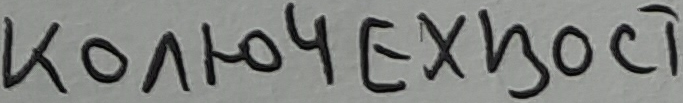колючехвост
